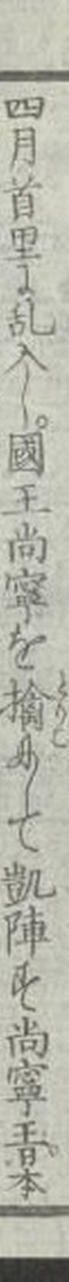四月首里に乱入し。国王尚寧を擒にして凱陣す尚寧王。日本
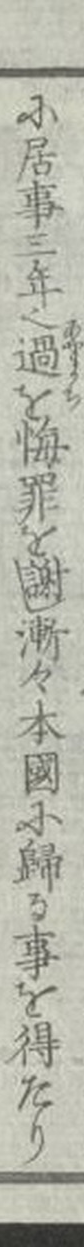に居事三年也過を悔罪を謝し漸々本国に帰る事を得たり
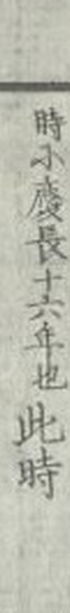時に慶長十六年也此時
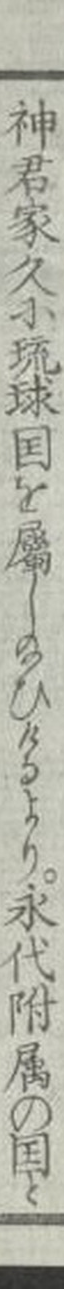神君家久に琉球国を属し給ひけるより。永代附属の国と
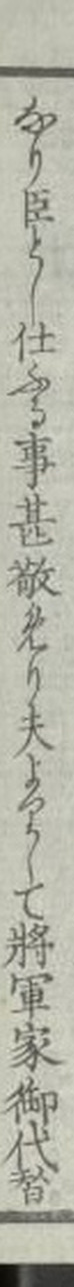なり臣とし仕ふる事甚敬めり夫よりして将軍家御代替
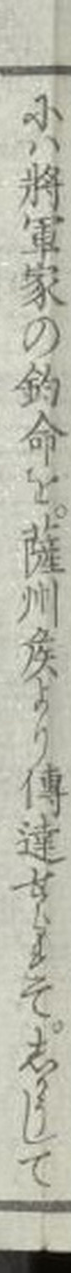には将軍家の鈞命を。薩州侯より伝達せられて。しかうして
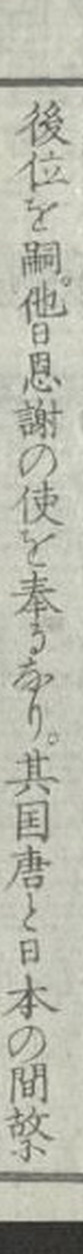後位を嗣。他日恩謝の使を奉るなり。其国唐と日本の間故に
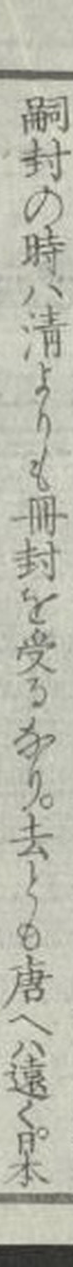嗣封の時は清よりも冊封を受るなり。去とも唐へは遠く。日本
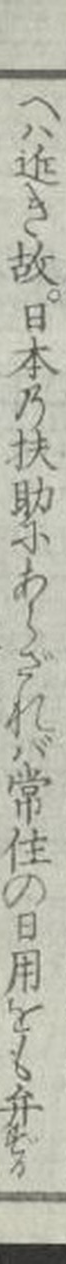へは近き故。日本の扶助にあらざれば常住の日用をも弁ずる
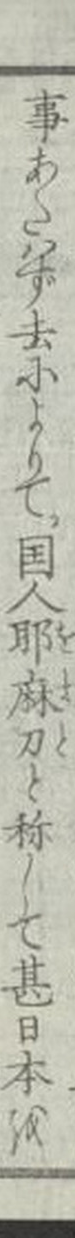事あたはず去によりて。国人耶麻刀と称して甚日本を
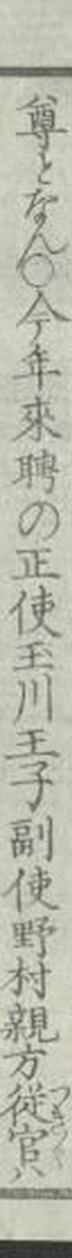尊となん○今年来聘の正使玉川王子副使野村親方従官は
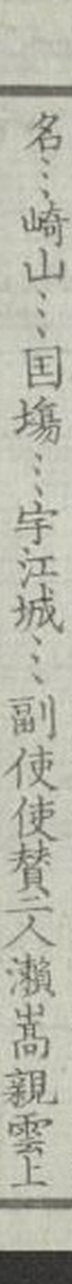名・・・崎山・・・国場・・・宇江城・・・副使使賛二人瀬嵩親雲上
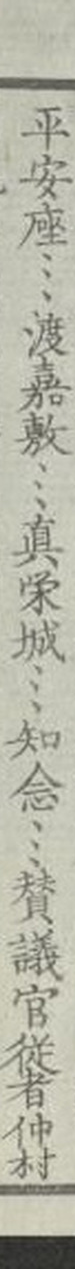平安座・・・渡嘉敷・・・真栄城・・・知念・・・賛議官従者仲村
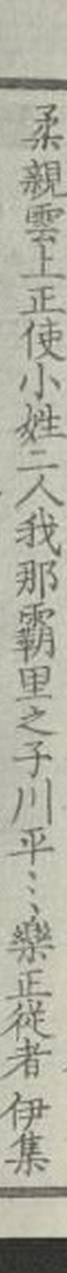柔親雲上正使小姓二人我那覇里之子川平・・・楽正従者伊集
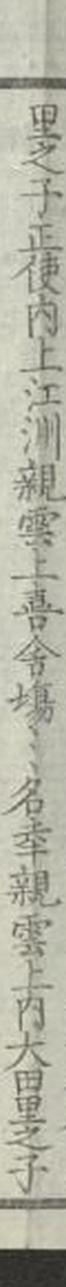里之子正使内上江洲親雲上喜舎場・・・名幸親雲上内大田里之子
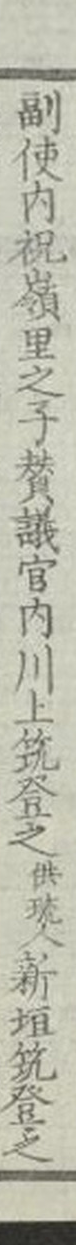副使内祝嶺里之子賛議官内川上筑登之供琉人新垣筑登之
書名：中山国使略
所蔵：University of the Ryukyus Library
